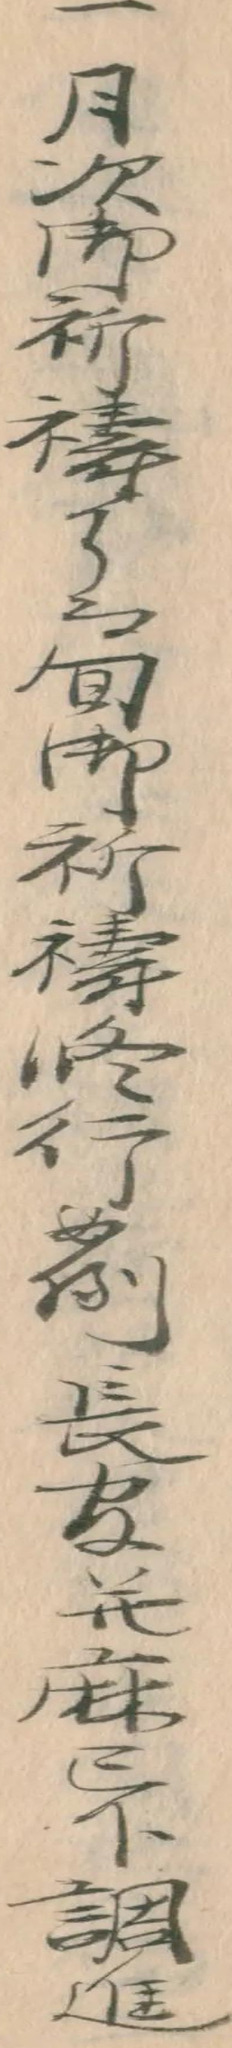一月次御祈祷了而旬御祈禱修行如例長官并麻已下調進
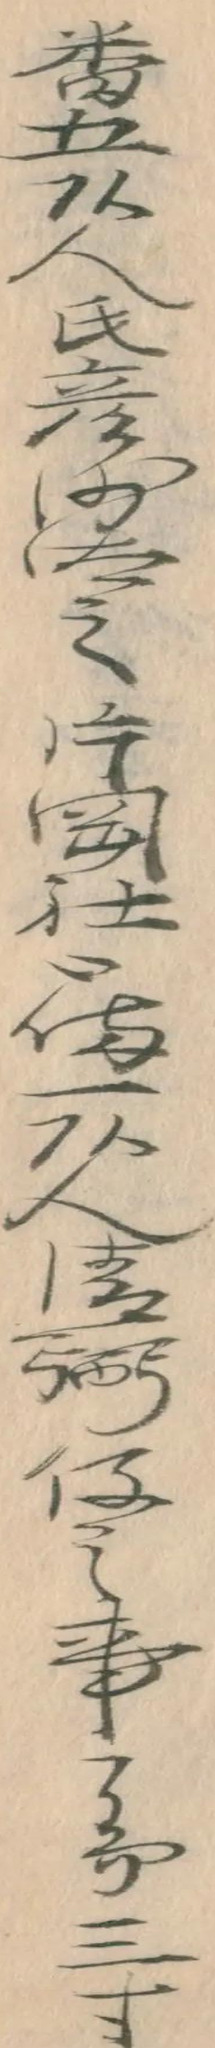番五頭人氏彦沙汰之片岡社御備一頭人清弼役之事了而三寸
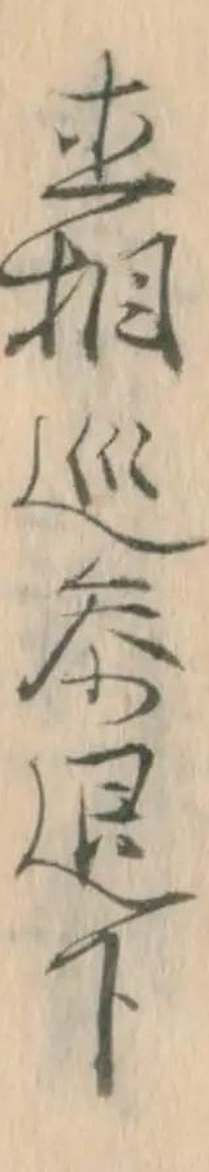直相巡参退下

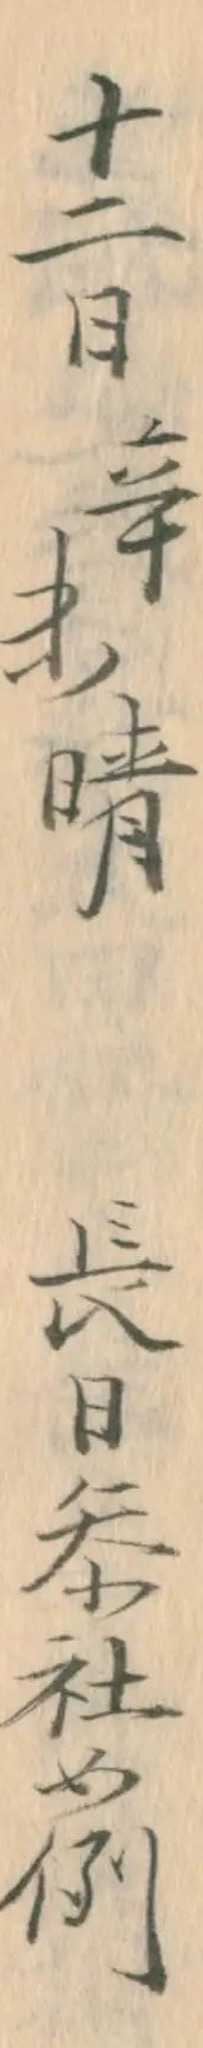十二日辛巳晴長日参社如例
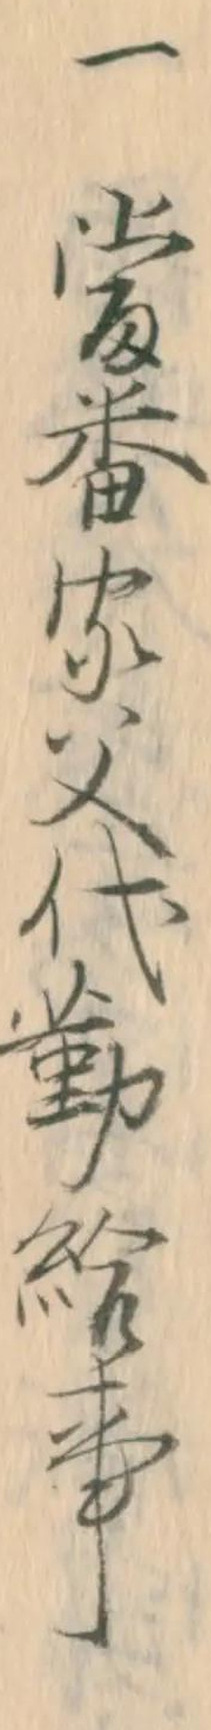一當番家父代勤給事
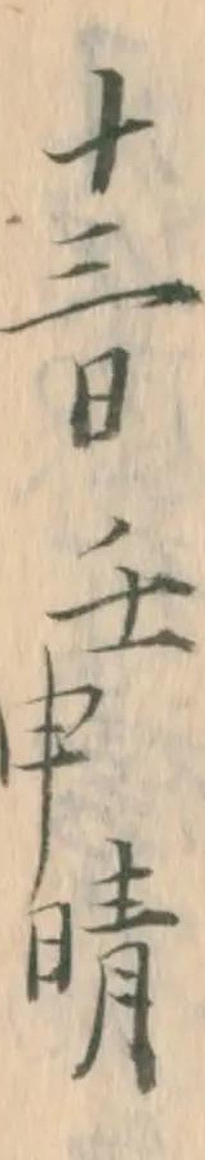十三日壬申晴
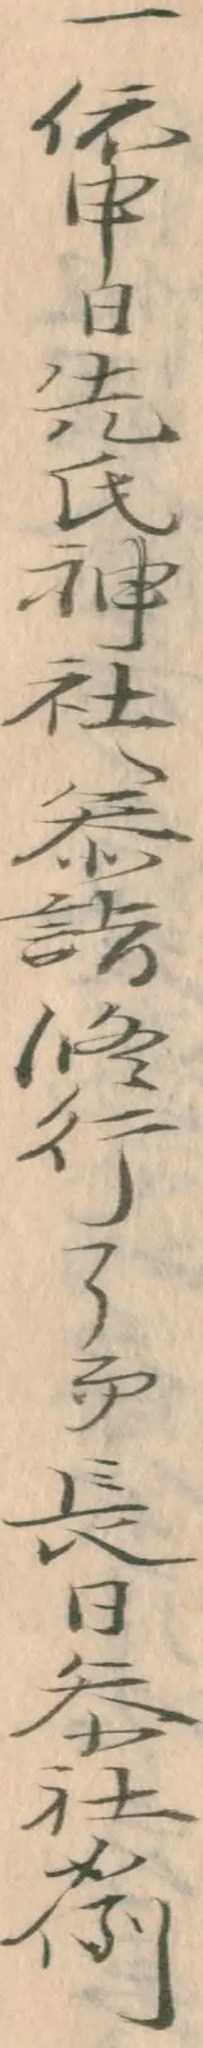一依申日先氏神社へ参詣修行了而長日参社如例
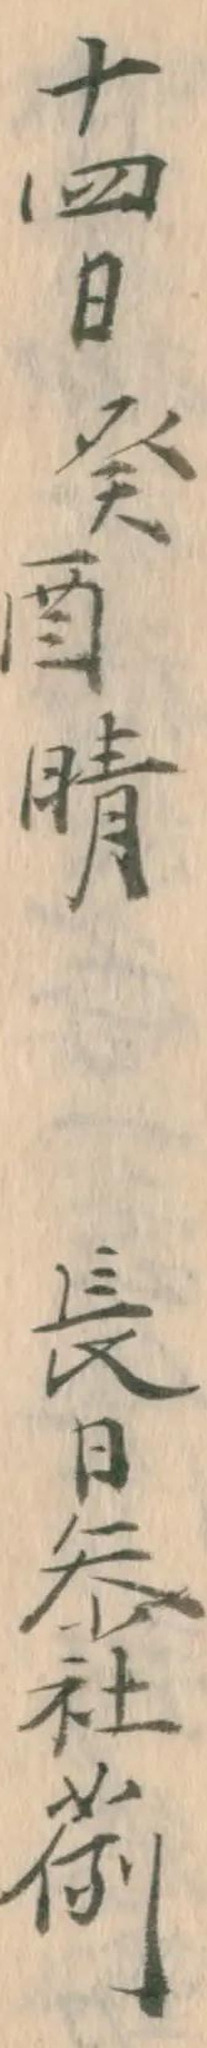十四日癸酉晴長日参社如例
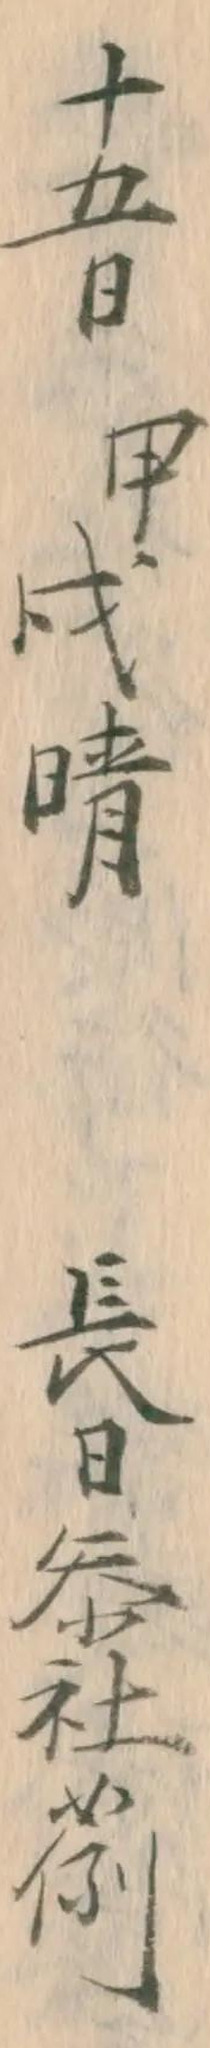十五日甲戌晴長日参社如例
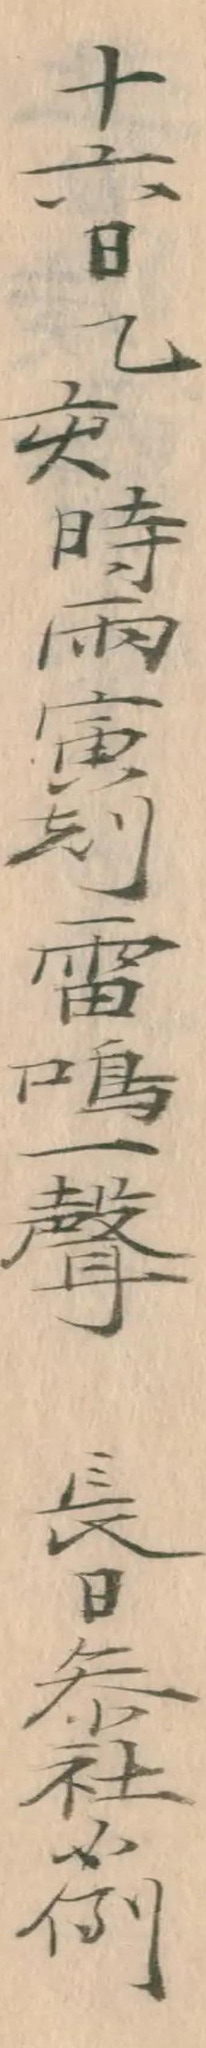十六日乙亥時雨寅刻雷鳴一聲長日参社如例
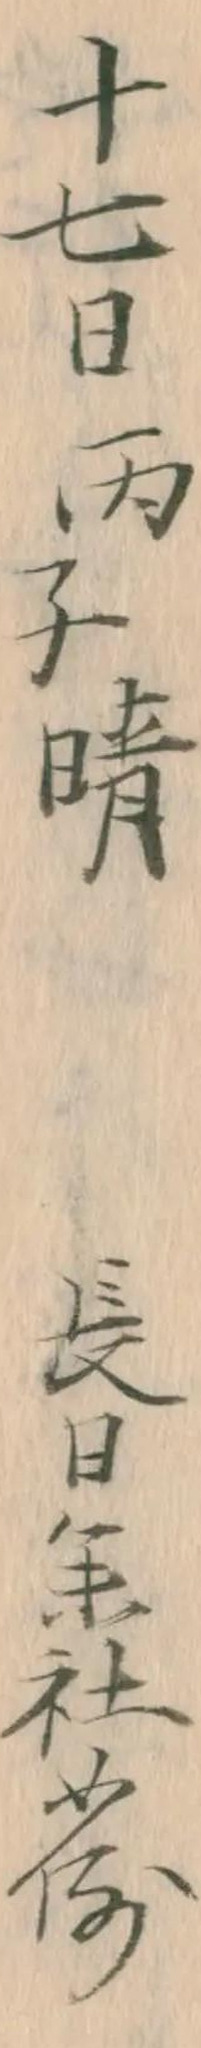十七日丙子晴長日参社如例
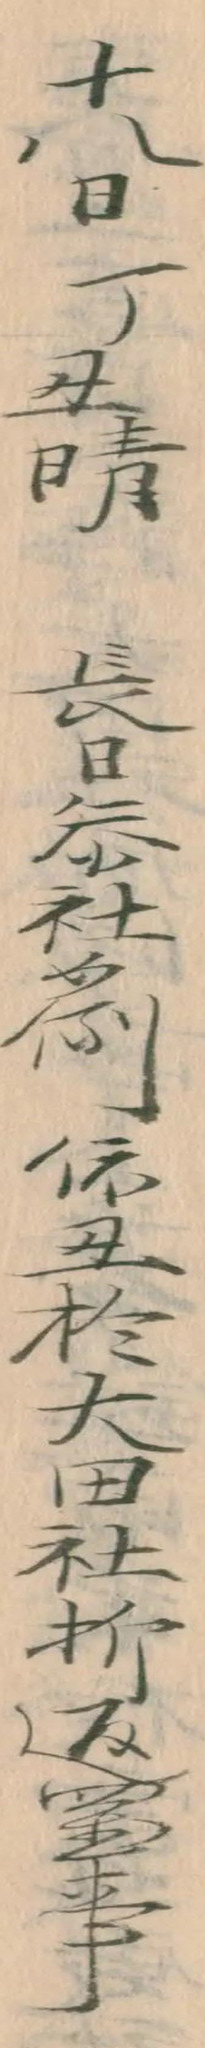十八日丁丑晴長日参社如例依丑於大田社折返置事
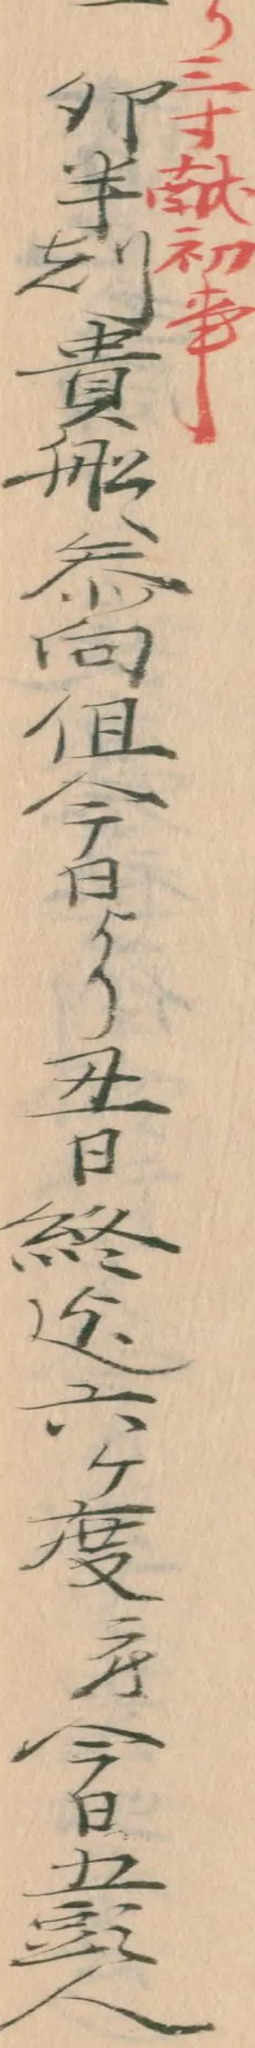一卯半刻貴舩へ参向但今日より丑日終迄六ケ度ニ付今日五頭人
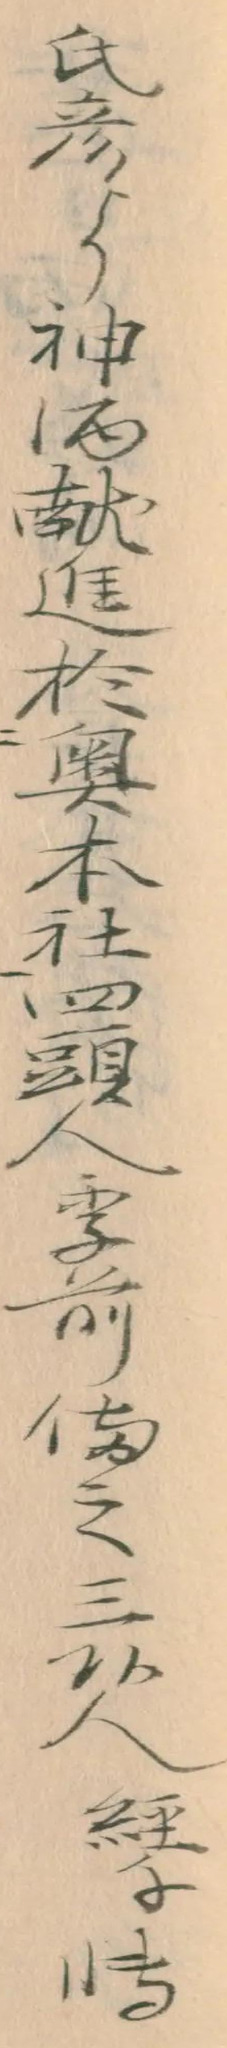氏彦より神酒献進於奥本社四頭人季前備之三頭人経千轉
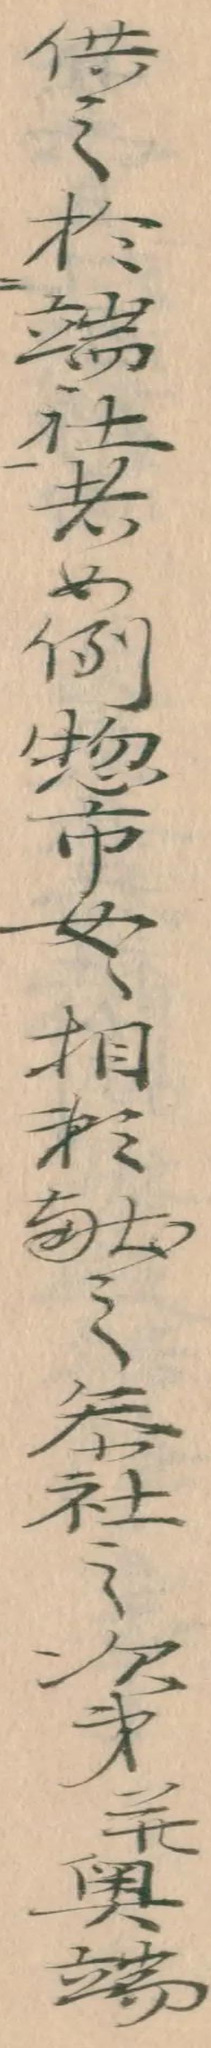供之於端社は如例惣市女へ相頼献之参社之次第幷奥端
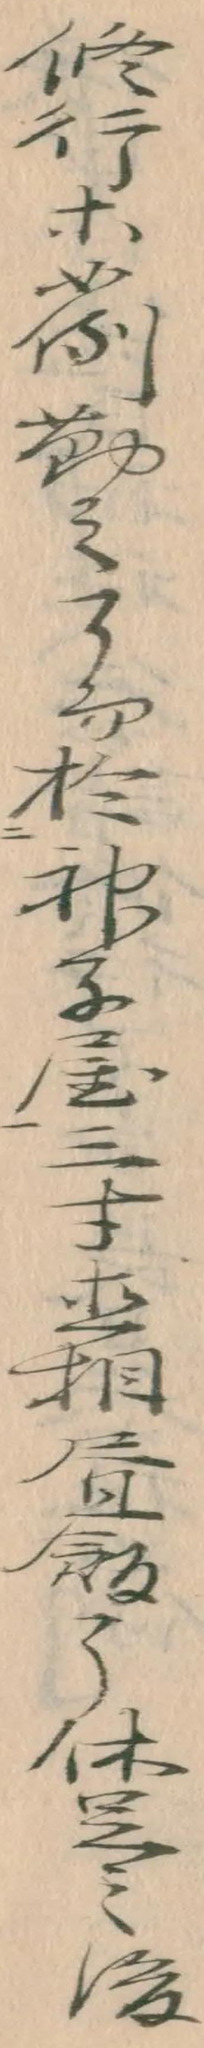修行等如例勤之了而於神子屋三寸直相昼飯了休足之後
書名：賀茂社記録. 第74冊
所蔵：国立国会図書館 National Diet Library, JAPAN
